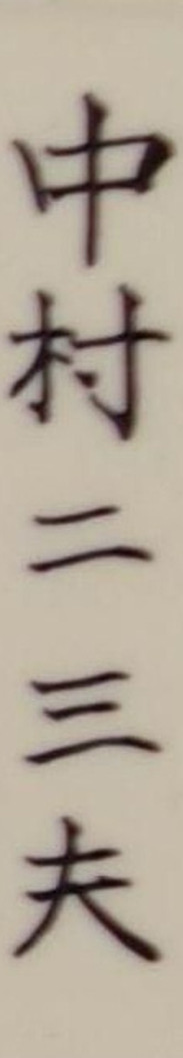中村二三夫
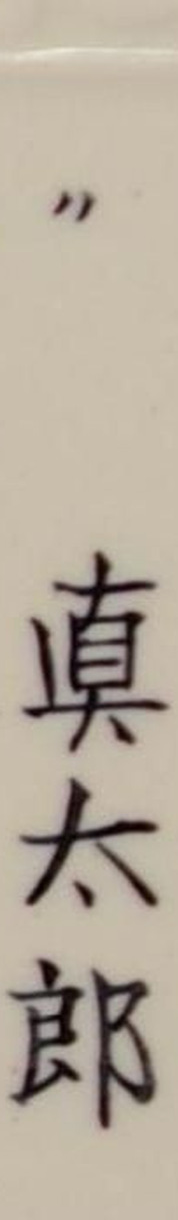真太郎
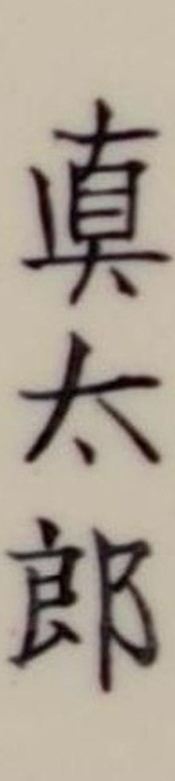真太郎
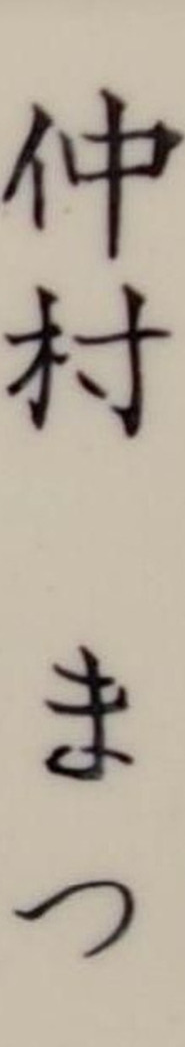仲村まつ
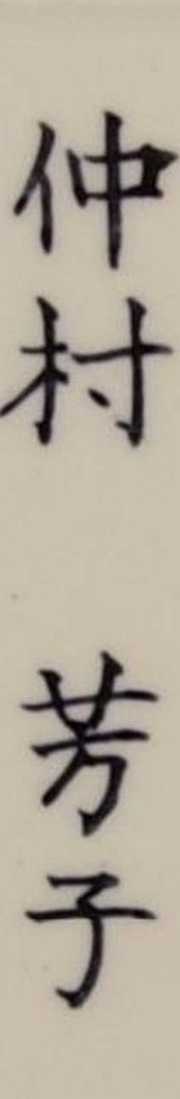仲村芳子
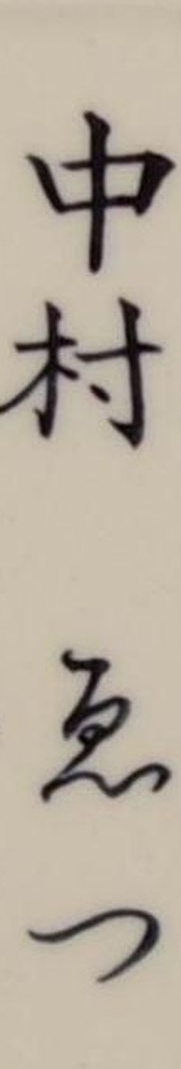中村ゑつ
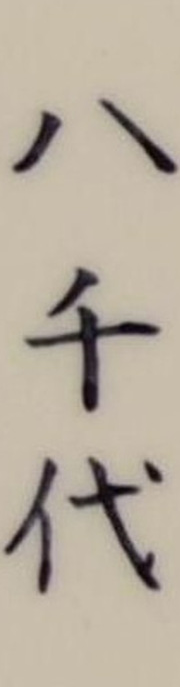八千代
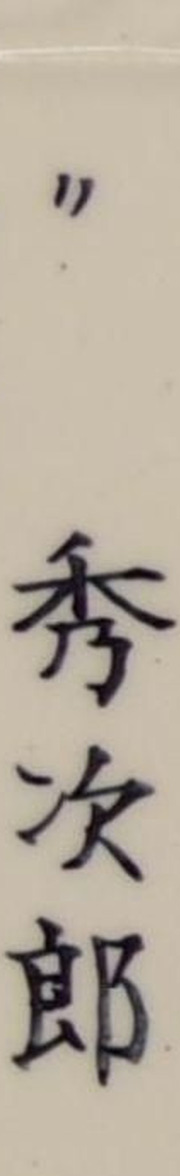秀次郎
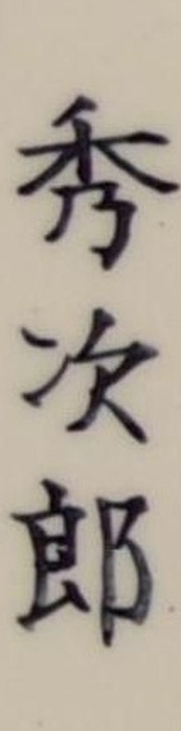秀次郎
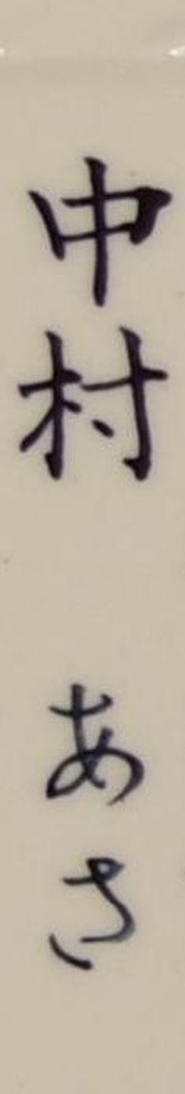中村あさ

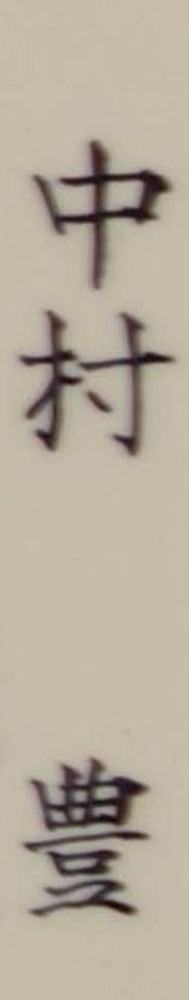中村豊
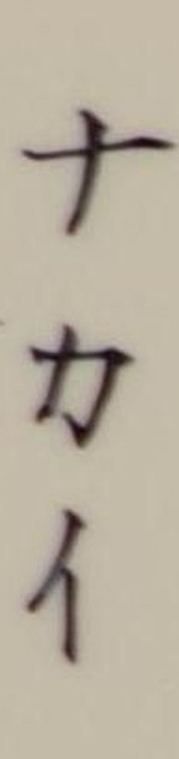ナカイ
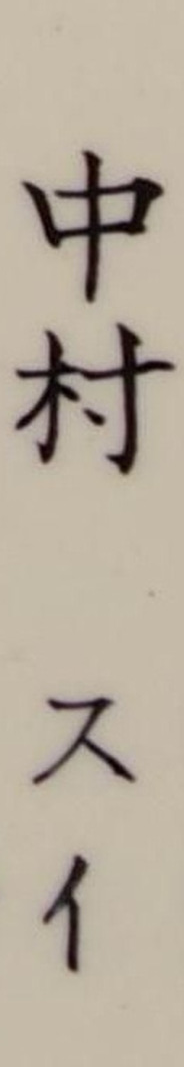中村スイ
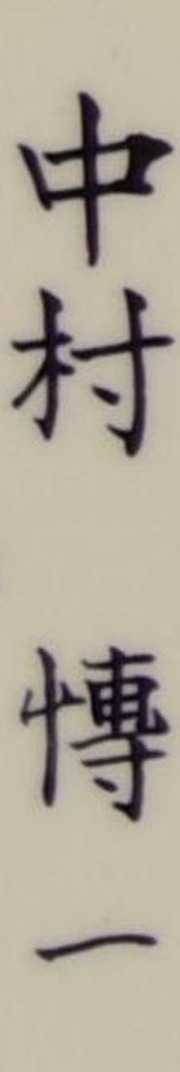中村博一
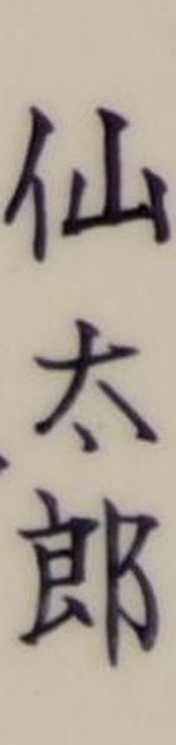仙太郎

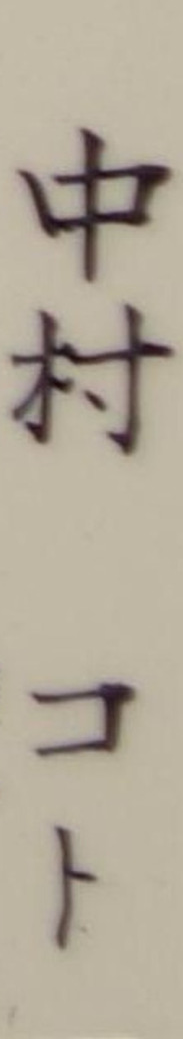中村コト
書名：E~L
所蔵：高野山金剛峯寺
